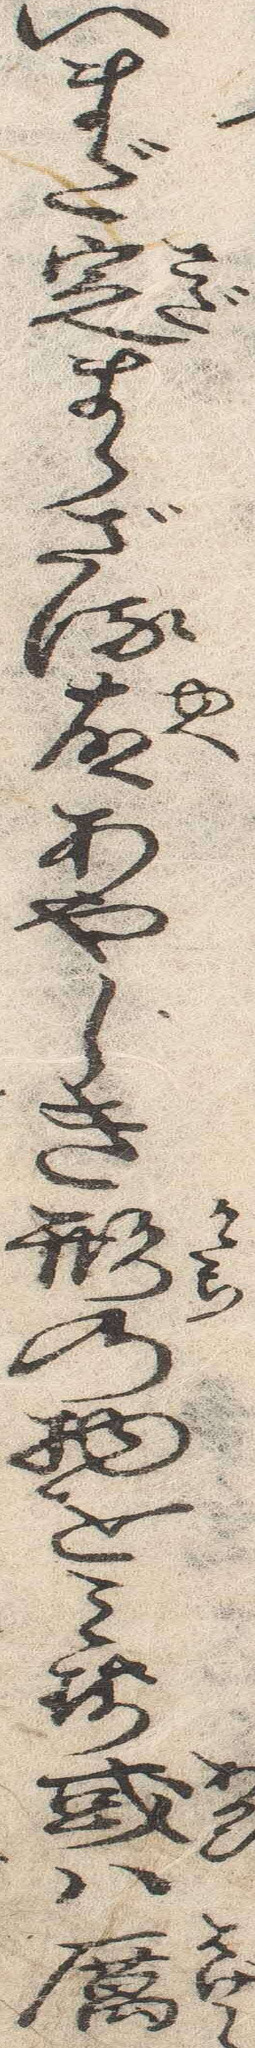いまだ定まらざる故あやしき形の物をみせ或は厲
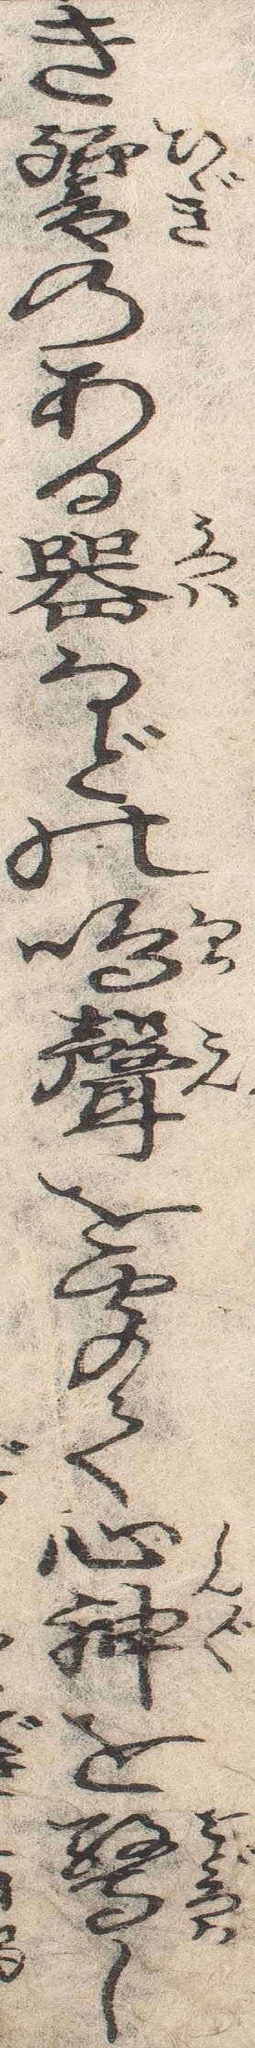き響のある器などの鳴声を聞て心神を驚し
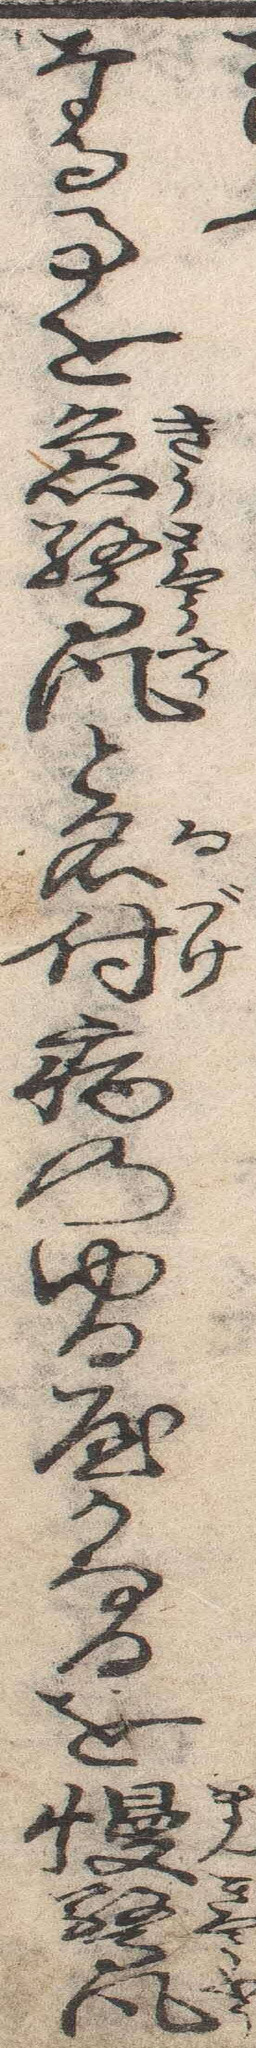なる事を急驚風と名付病のゆるやかなるを慢驚風
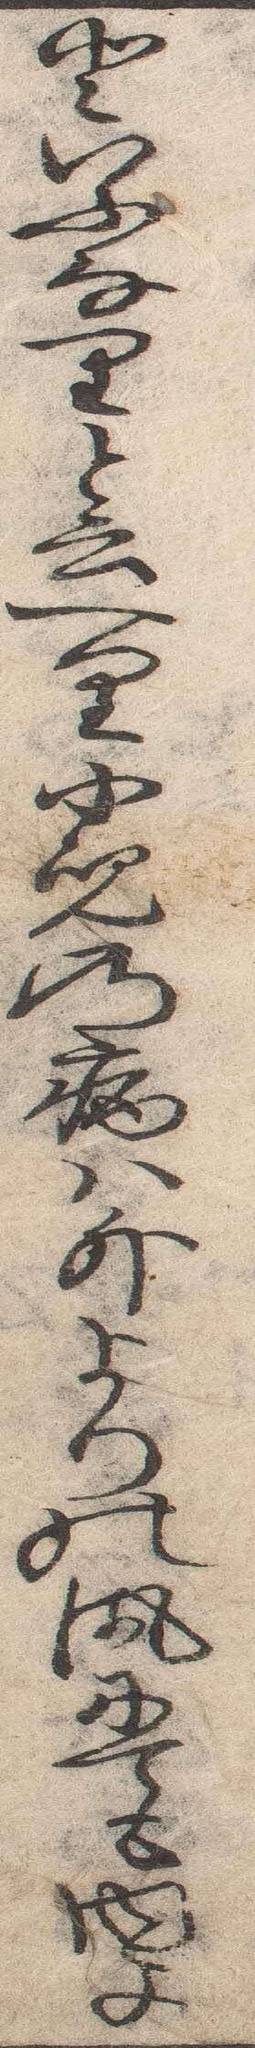といふなりと云へり小児の病は外よりの風にても内よ

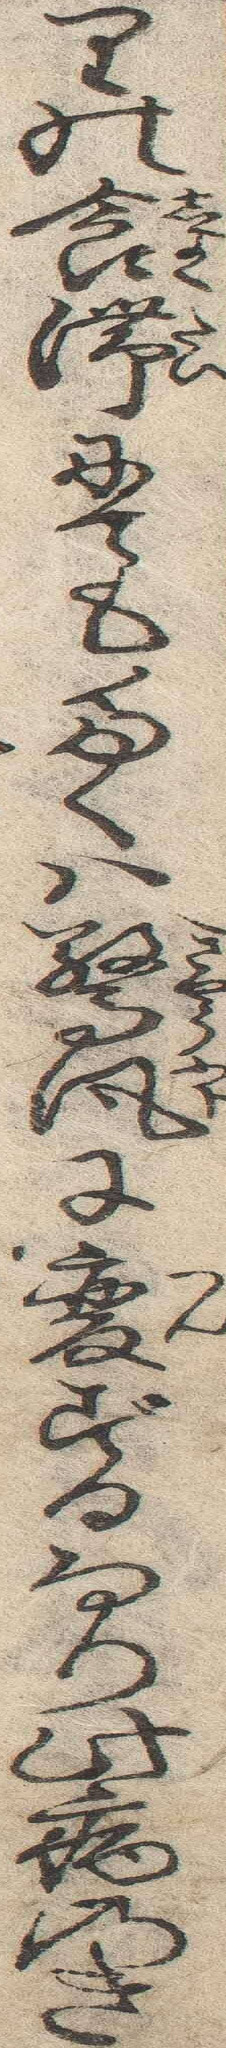りの食滞にても多くは驚風に変ずるなり此の病のき
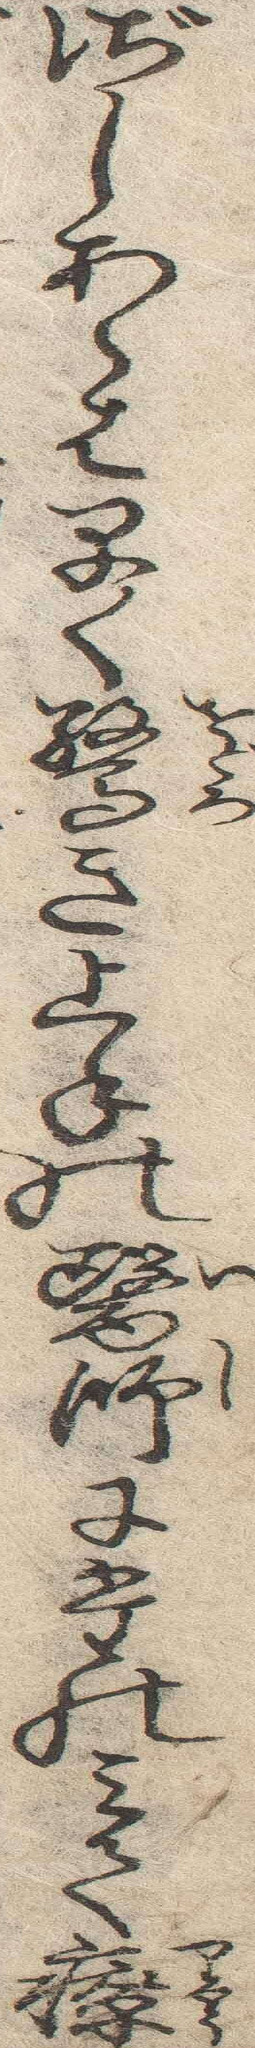ざしあらは早く驚き上手の医師にたのみて療
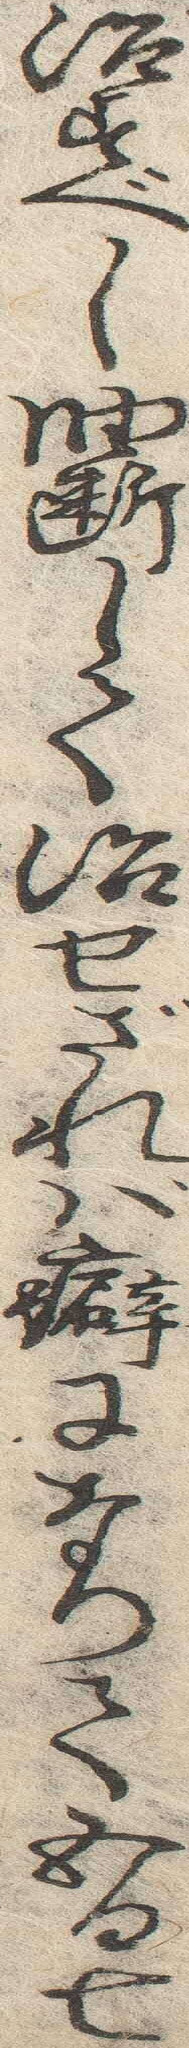治すべし油断して治せざれば癖になりて五日七
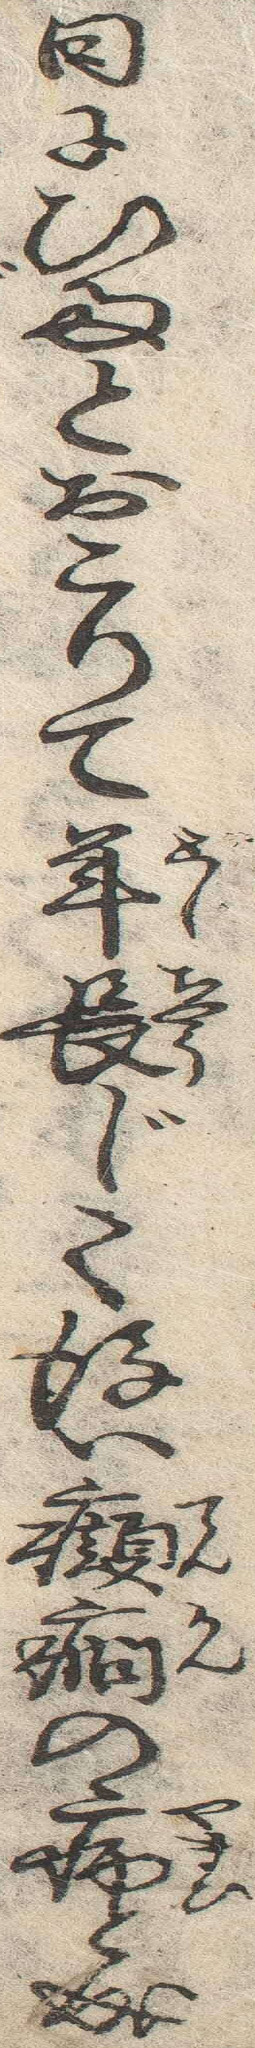日にひたとおこりて年長じて後は癲癇の病と成
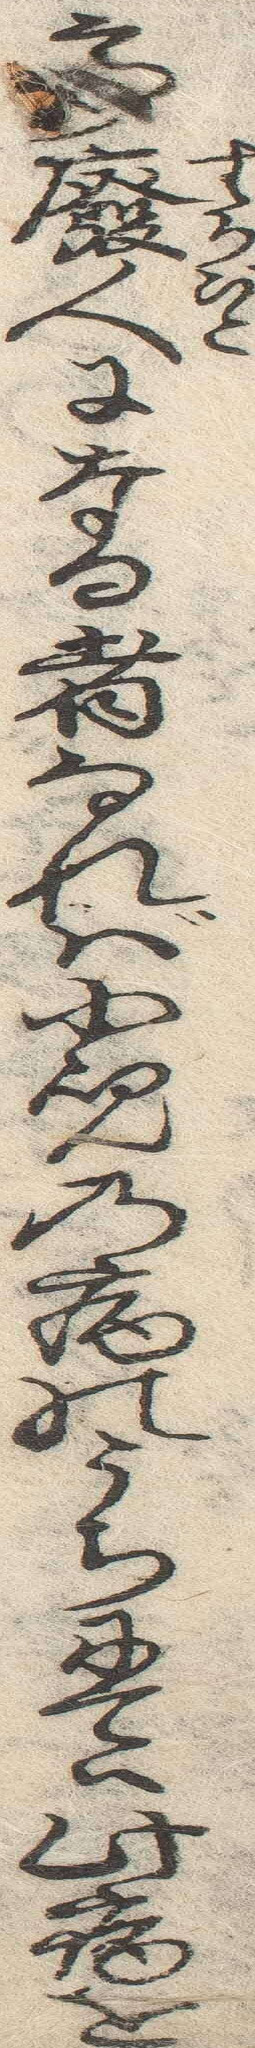て廃人になる者なれば小児の病のうちにては此病を
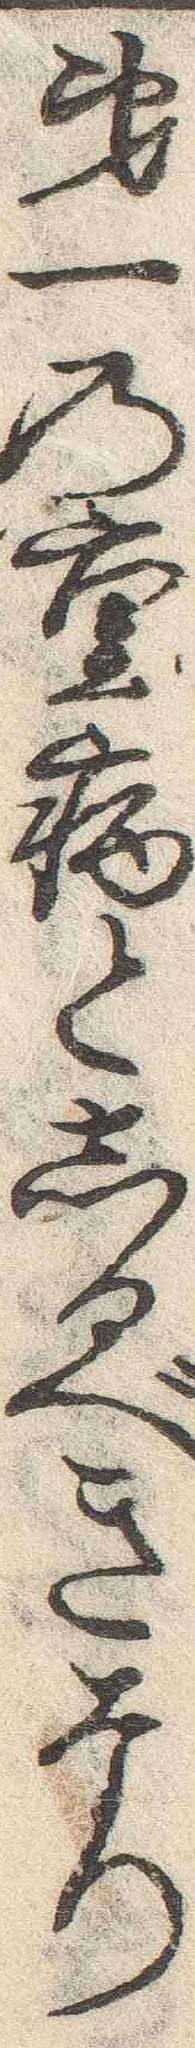第一の重病としるべきなり
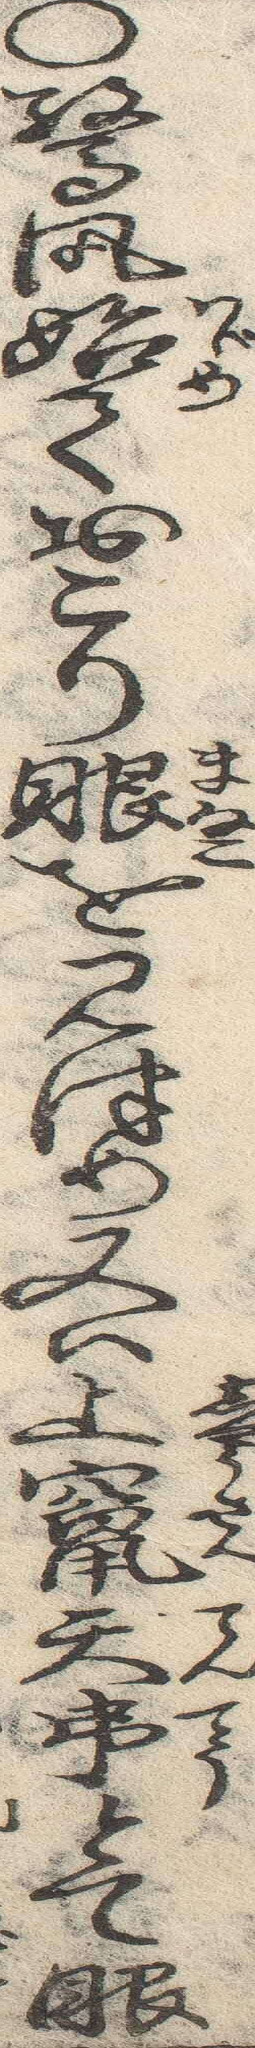○驚風始ておこり眼を見つめ又は上竄天弔とて眼
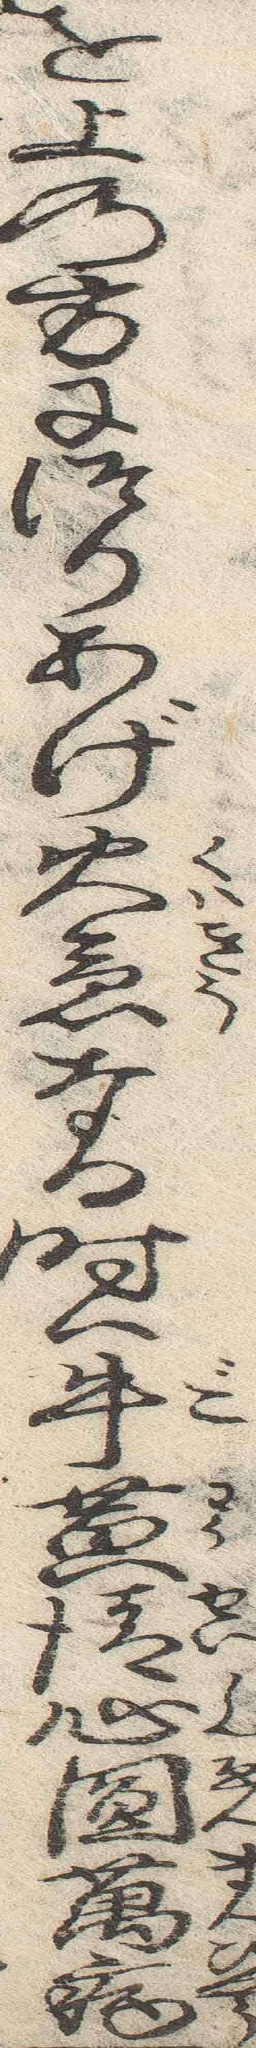を上の方につりあげ火急なる時は牛黄清心円万病
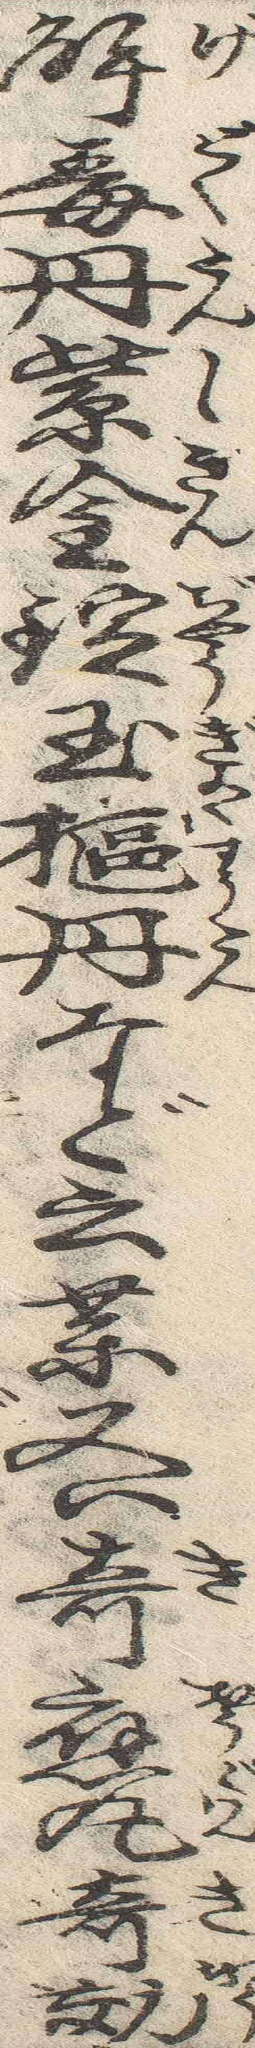解毒丹紫金錠玉枢丹など云薬又は奇応丸奇効
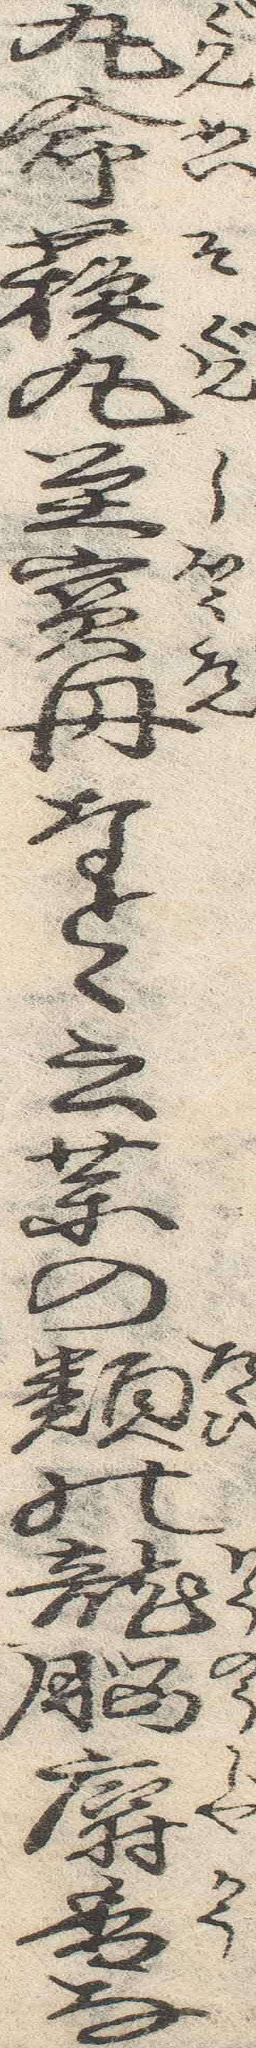丸命蘇丸至宝丹なとゝ云薬の類の龍脳麝香な
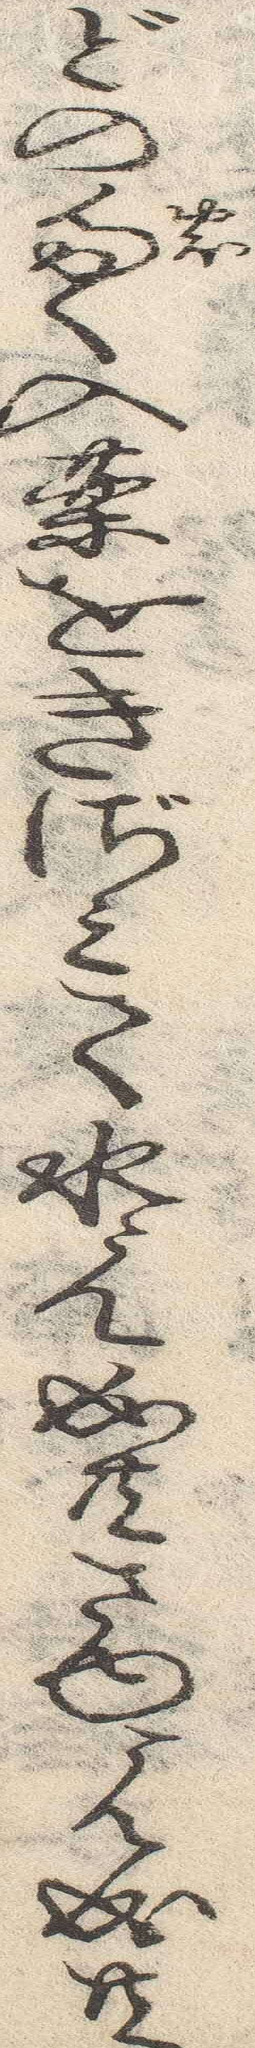どの多く入葉をきざみて水にて成共さゆにて成共
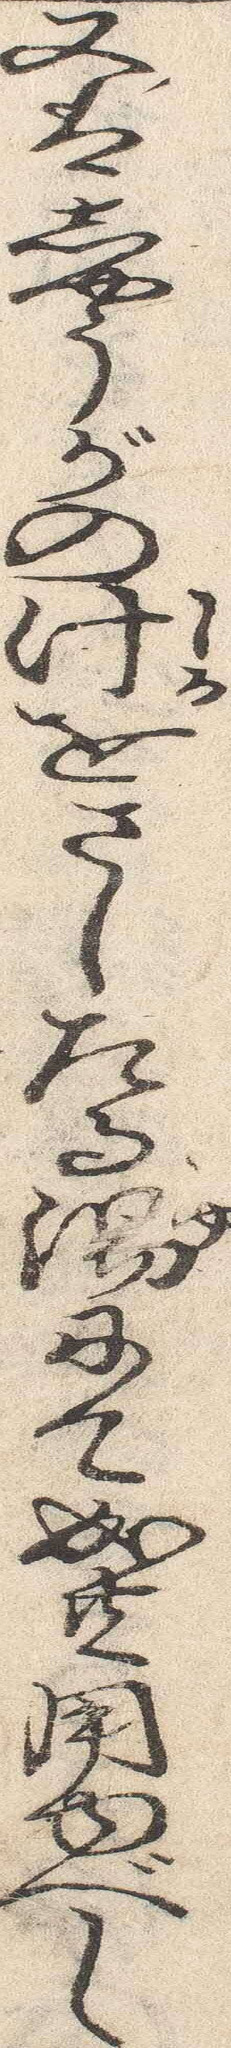又はしやうがの汁をさしたる湯にて成共用ゆべし
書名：小児必用養育草
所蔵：東京学芸大学附属図書館 国文学研究資料館
